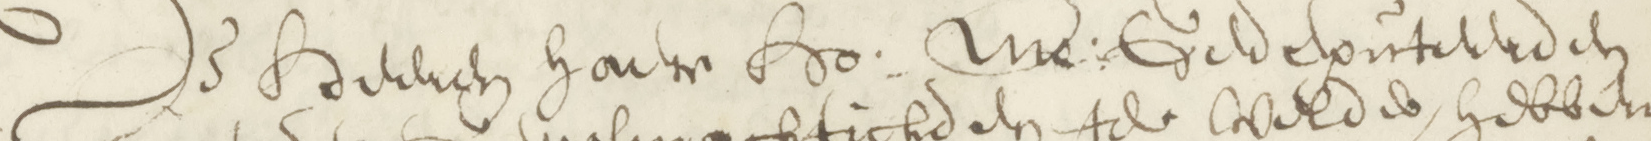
De Heeren haer Ho:Mo: Gedeputeerden
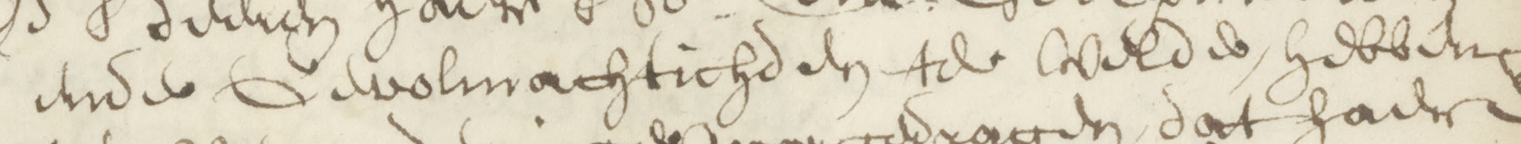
ende Gevolmachtichden te Velde, hebben
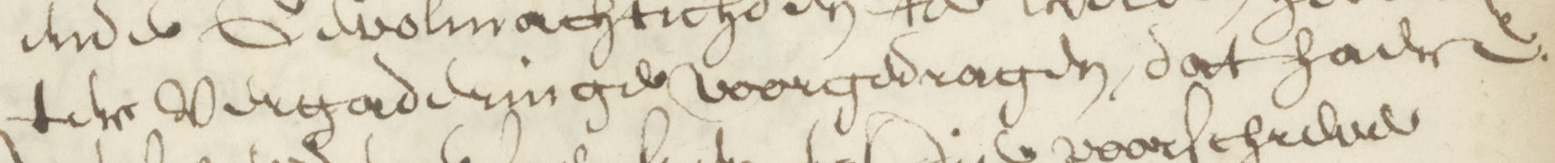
ter Vergaderinge voorgedragen, dat haer E.
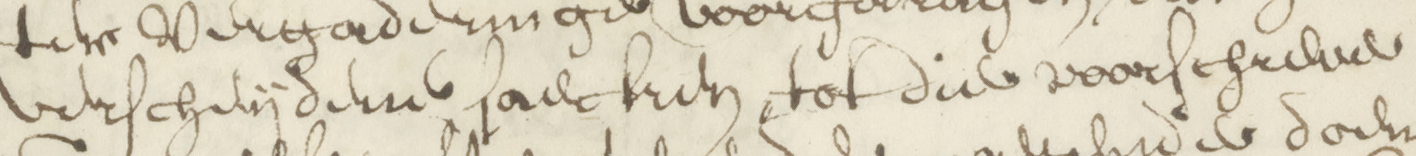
verscheijdene saecken tot die voorschreve
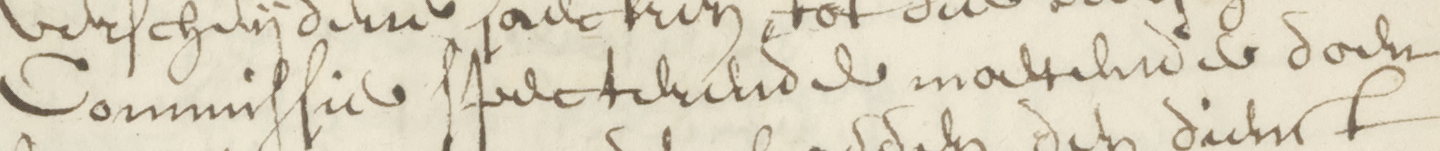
Commissie specterende moetende doen
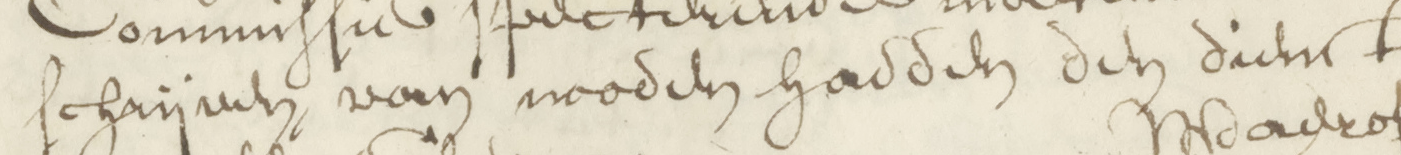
schrijven, van nooden hadden den dienst
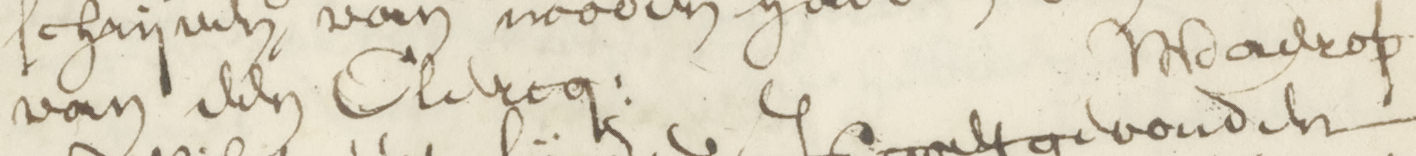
van een Clerq: Waerop
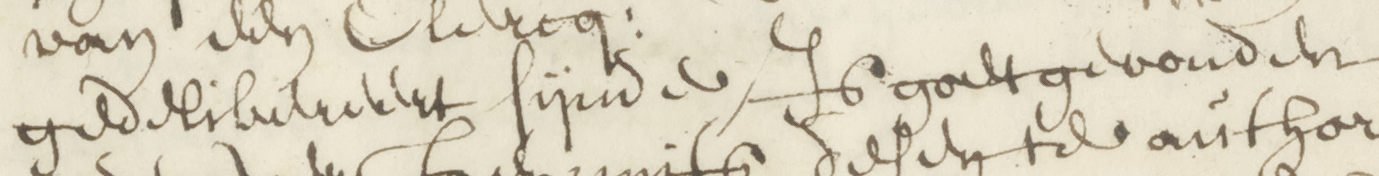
gedelibereert sijnde, Is goetgevonden
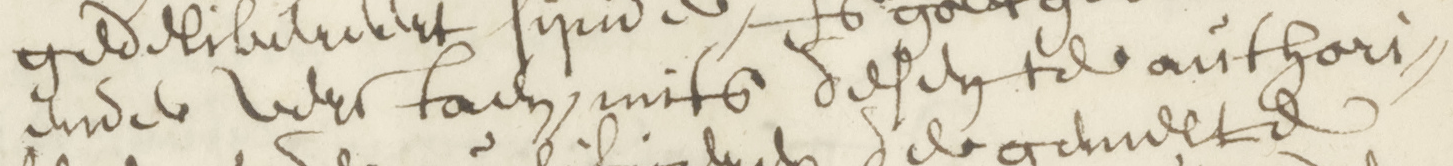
ende verstaen, mits desen te authori„
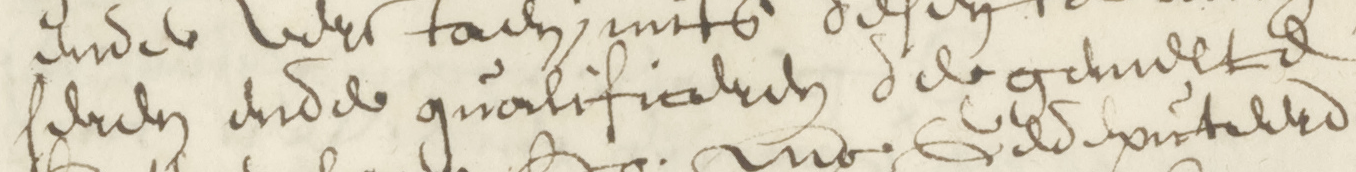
seren ende qualificeren de gemelte
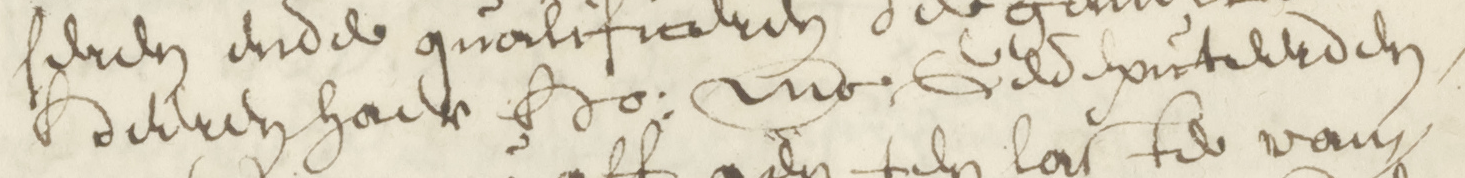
Heeren haer Ho:Mo: Gedeputeerden,
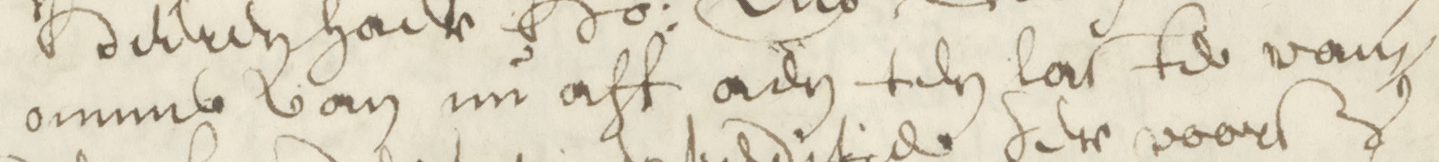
omme van nu aff aen ten laste van,,
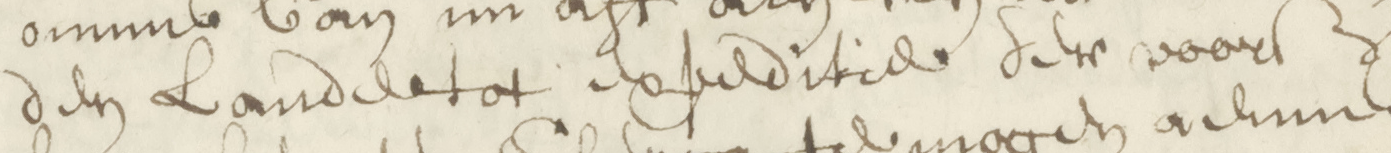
den Lande tot expeditie der voors
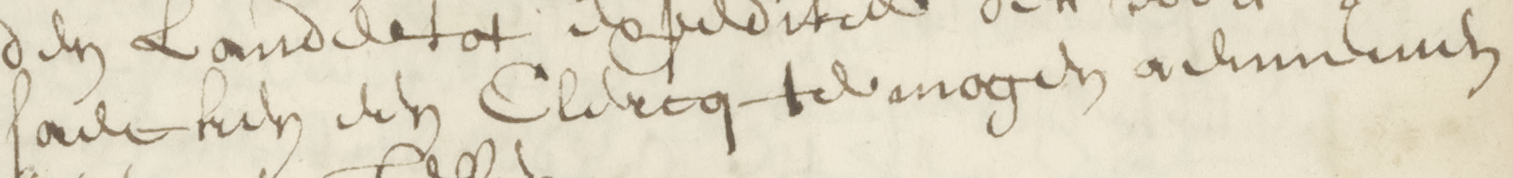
saecken een Clercq te mogen aennemen
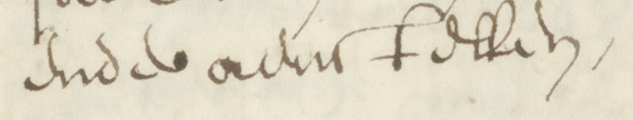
ende aenstellen.
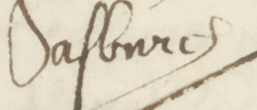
Sasburch
